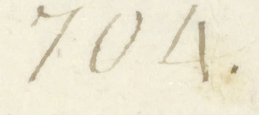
704.
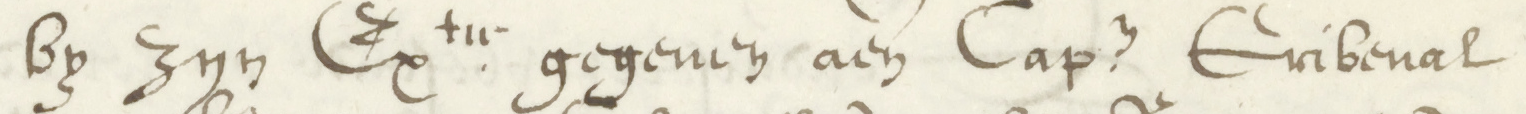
by zijn Extie gegeven aend. Capn Eribenal
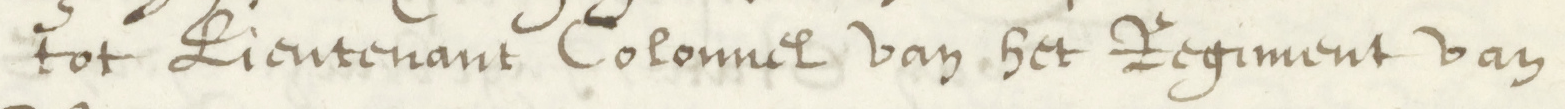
tot Lieutenant Colonnel van het Regiment van
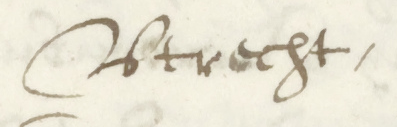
Utrecht.
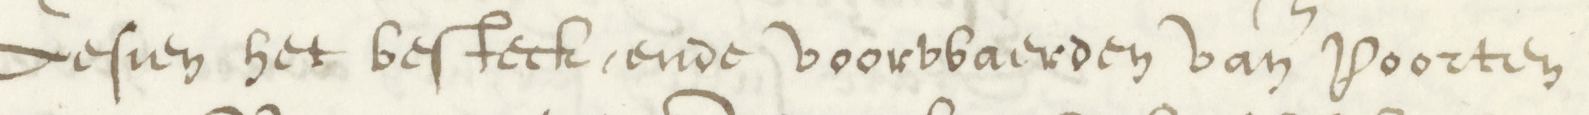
Gesien het besteck ende voorwaerden van poorten
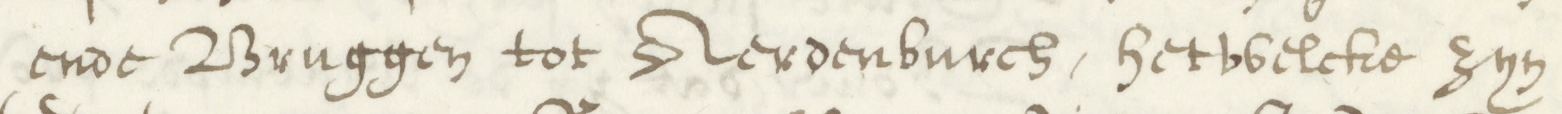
ende Bruggen tot Aerdenburch, hetwelcke zijn
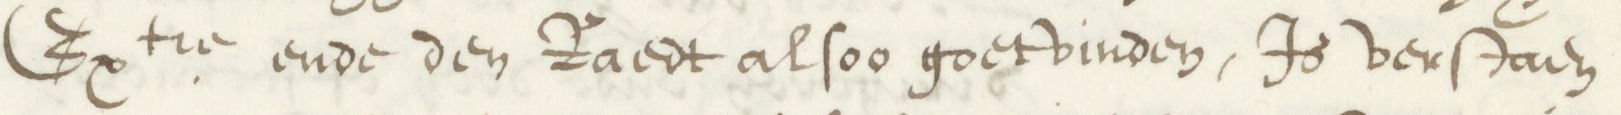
Extie ende den Raedt alsoo goetvinden, Is verstaen
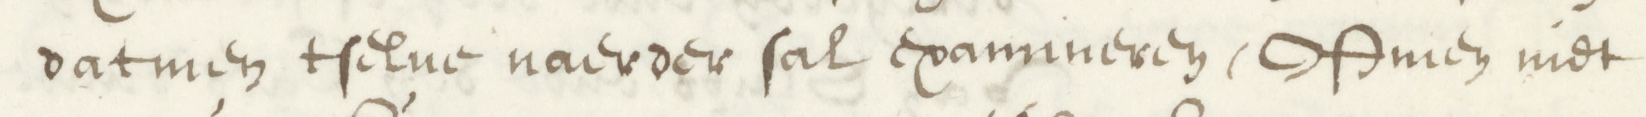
datmen tselue naerder sal examineren, off men niet
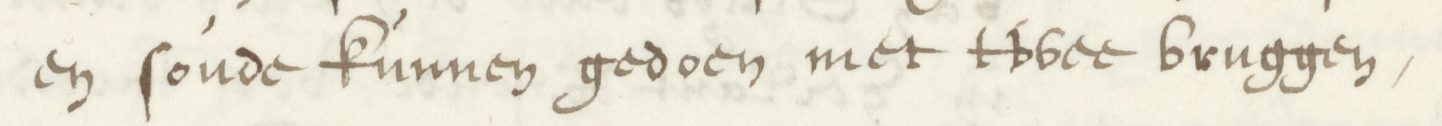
en soude kunnen gedoen met twee bruggen.
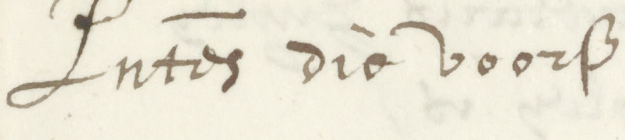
Pntes die voors
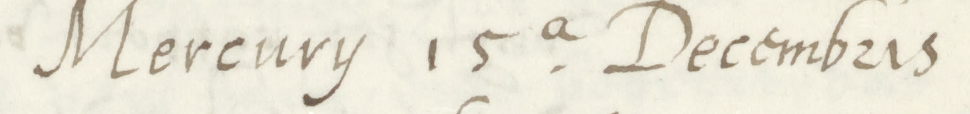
Mercury 15a Decembris
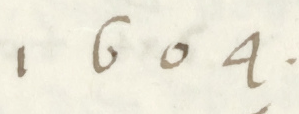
1604
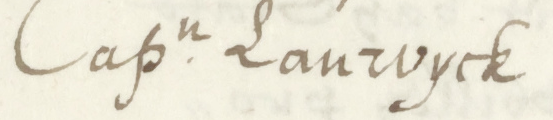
Capn Lauwyck
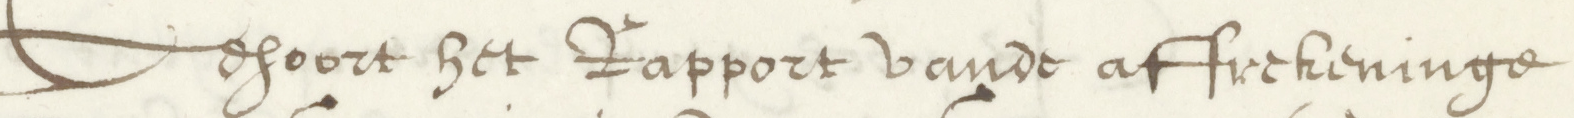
Gehoort het rapport vande affrekeninge
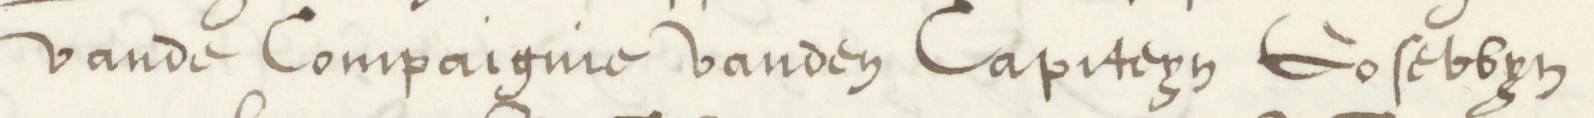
vande Compaignie vanden Capiteyn Gosewyn
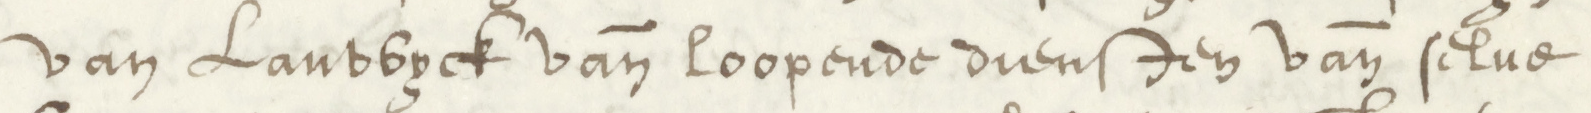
van Lauwyck van loopende diensten van selue
